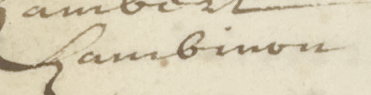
Lambinon
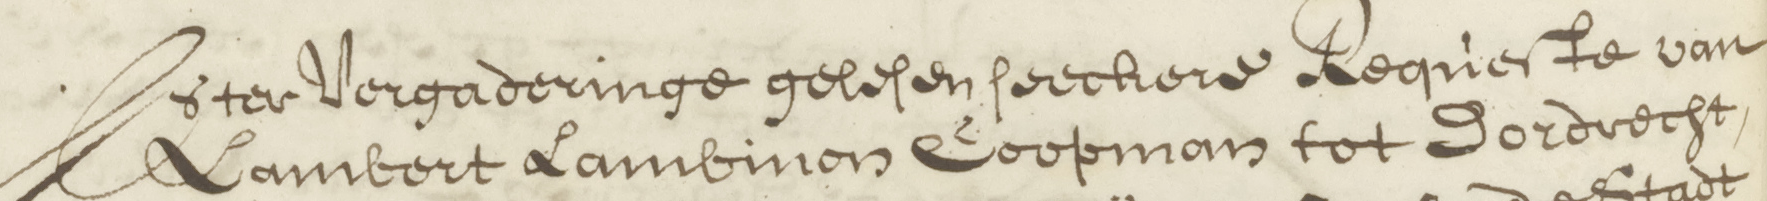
Is ter Vergaderinge gelesen seeckere Requeste van
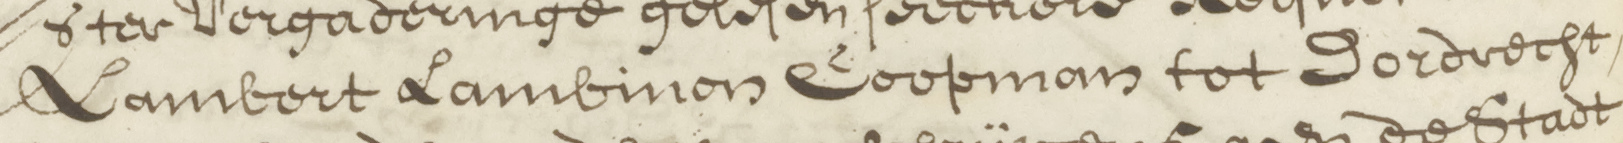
Lambert Lambinon Coopman tot Dordrecht,
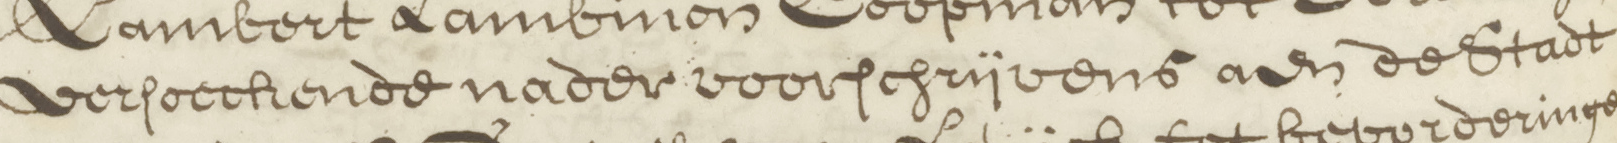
versoeckende nader voorschrijvens aen de Stadt
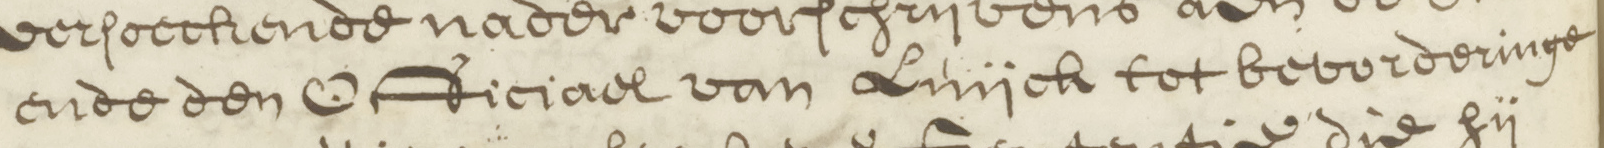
ende den Officiael van Luijck tot bevorderinge
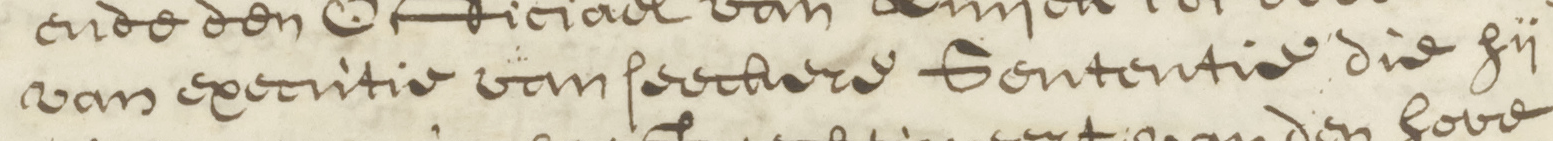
van executie van seeckere Sententie die hij
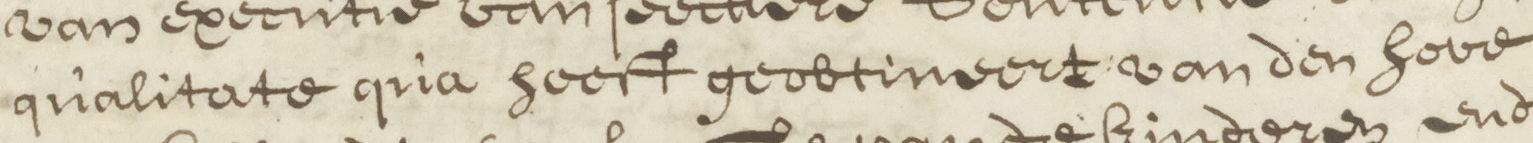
qualitate qua heeft geobtineert van den hove
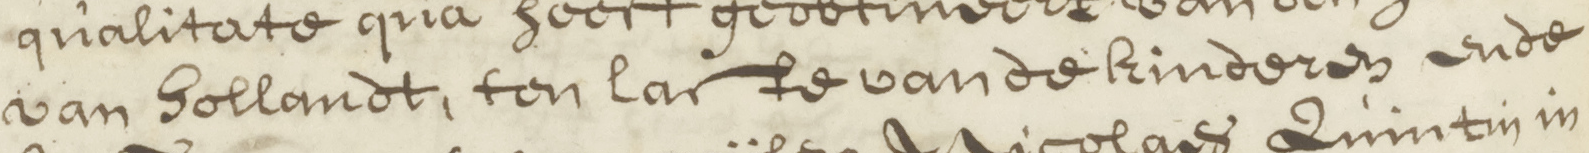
van Hollandt, ten laste van de kinderen ende
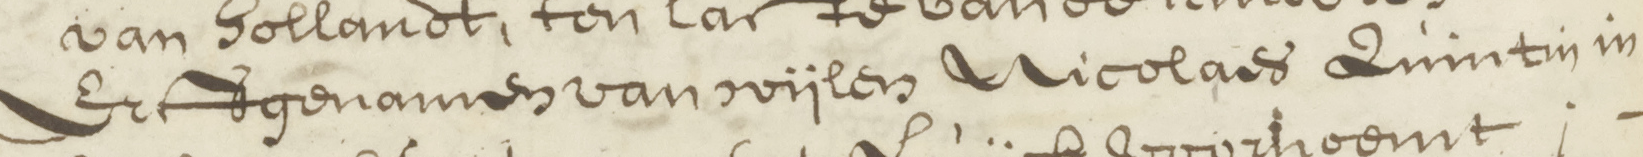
Erffgenamen van wijlen Nicolaes Quintin in
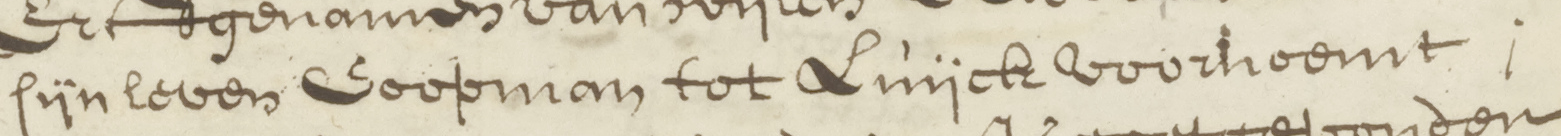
sijn leven Coopman tot Luijck voornoemt;
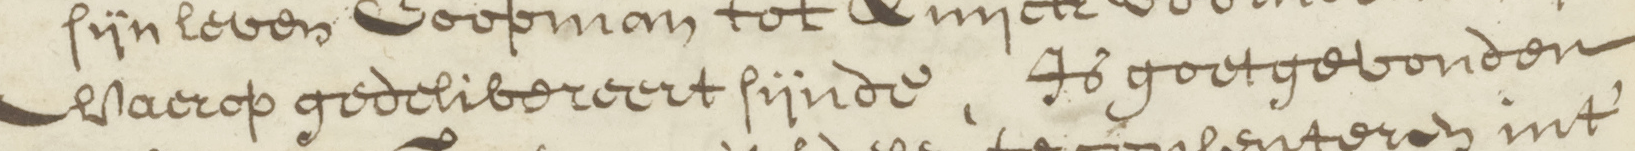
Waerop gedelibereert sijnde, Is goetgevonden
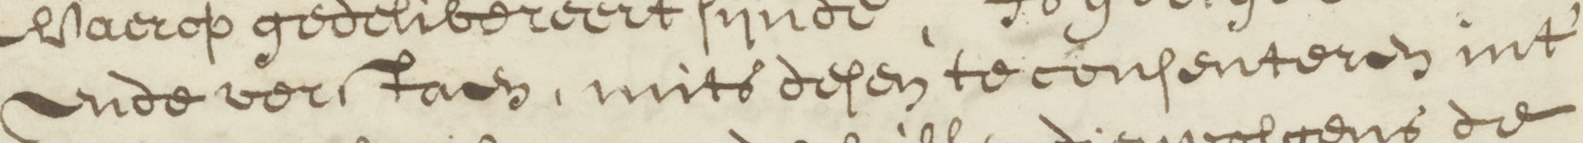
ende verstaen, mits desen te consenteren int'
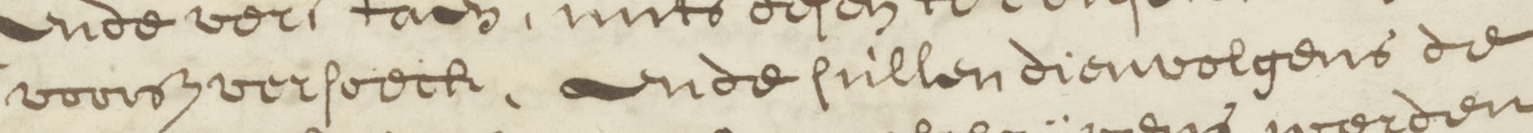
voors versoeck, ende sullen dienvolgens de
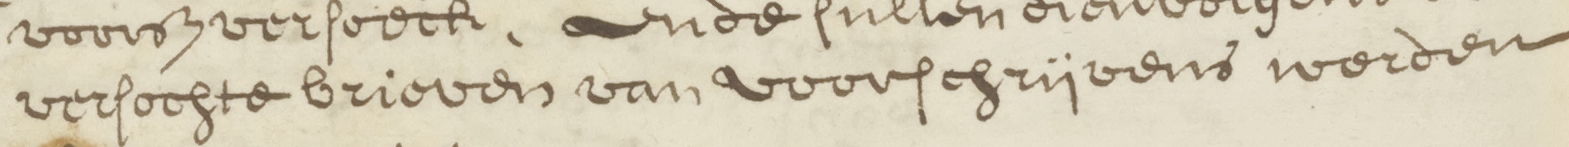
versochte brieven van voorschrijvens werden
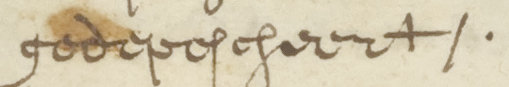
gedepescheert.
